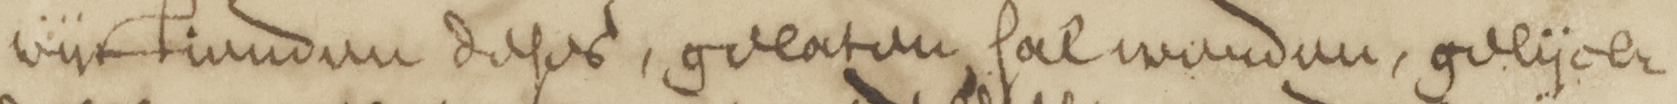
vijftienden deses, gelaten sal werden, gelijck
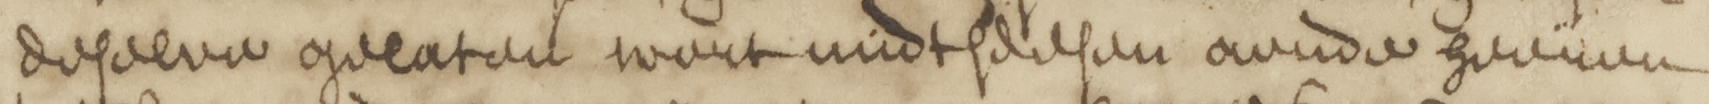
deselve gelaten wert midtsdesen aende heeren
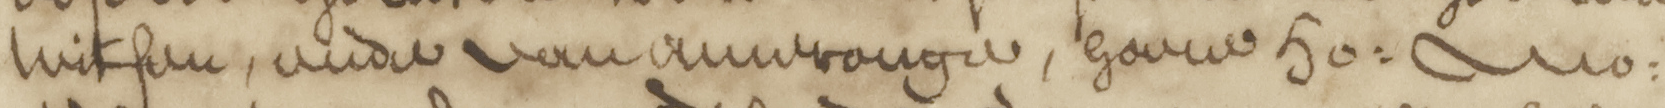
Witsen, ende van Ameronge, hare Ho:Mo:
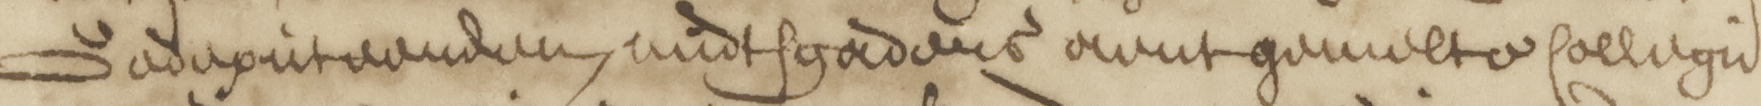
Gedeputeerden, midtsgaders aent gemelte Collegie
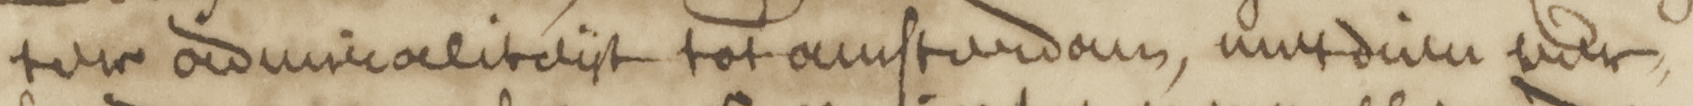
ter admiraliteijt tot amsterdam, met dien ver,,
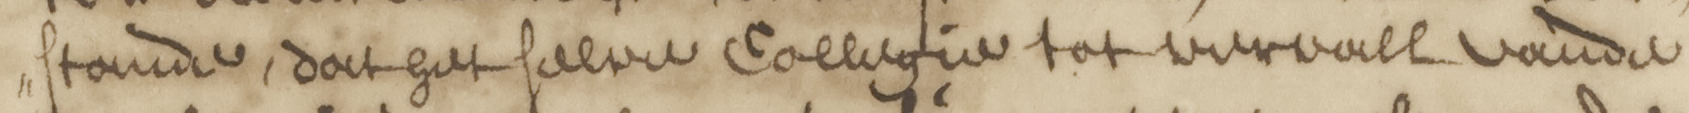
,,stande, dat het selve Collegie tot vervall vande
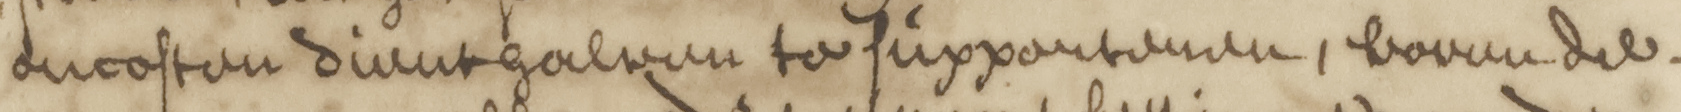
oncosten dienthalven te supporteren, boven de
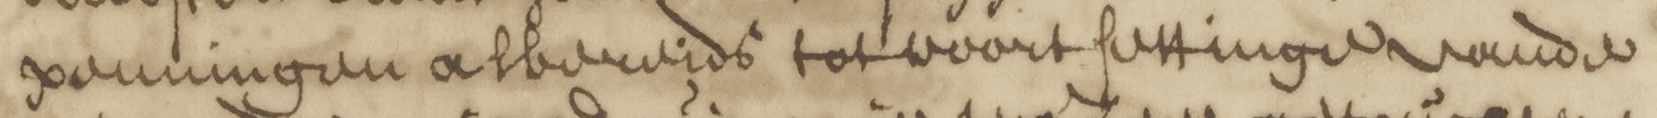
penningen albereids tot voortsettinge vande
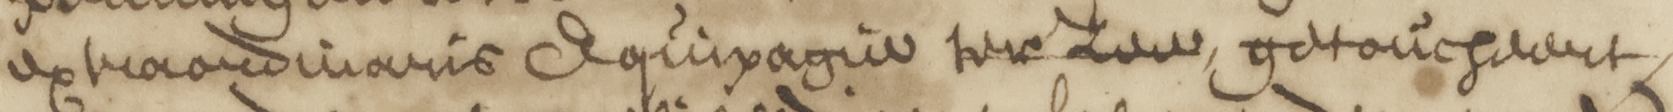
extraordinaris Equipagie ter Zee, getoucheert,
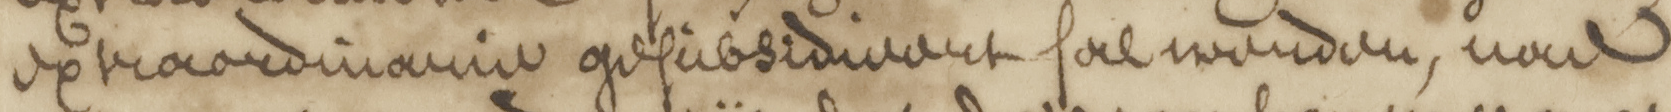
extraordinarie gesubsidieert sal werden, nae
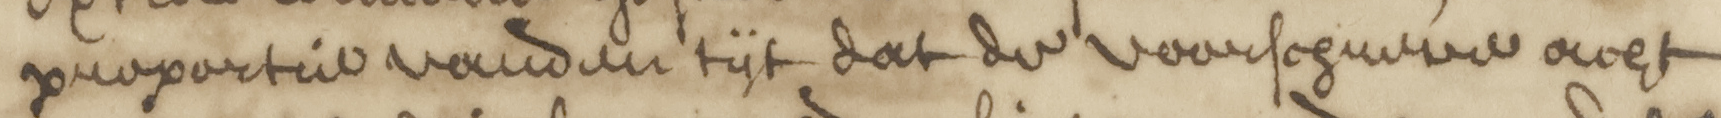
proportie vanden tijt dat de voorschreve acht
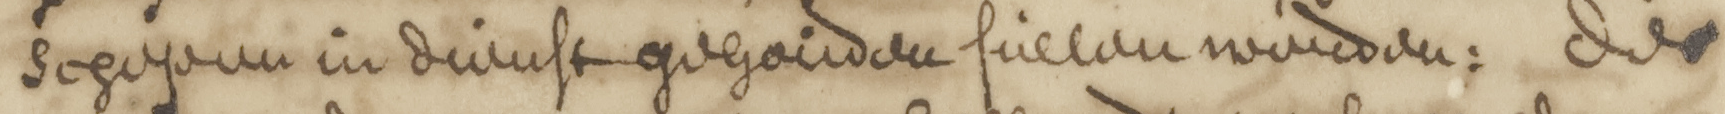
schepen in dienst gehouden sullen werden: Des
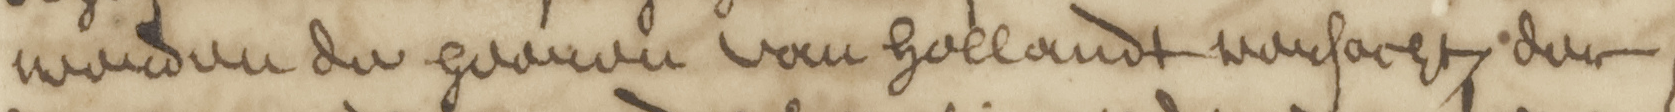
werden de heeren van hollandt versocht, der
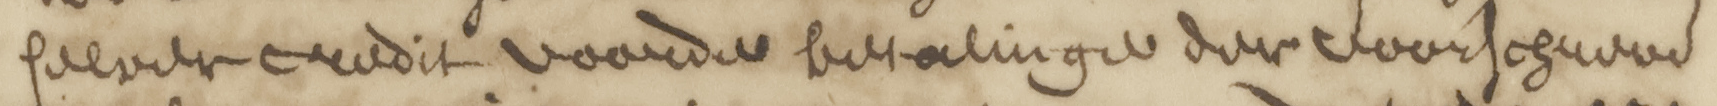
selver credit voorde betalinge der voorschreve
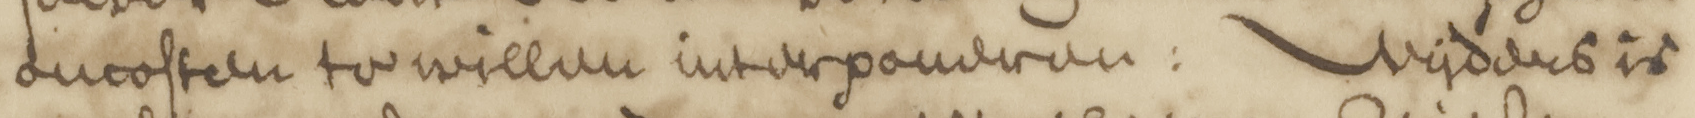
oncosten te willen interponeren: Wijders is
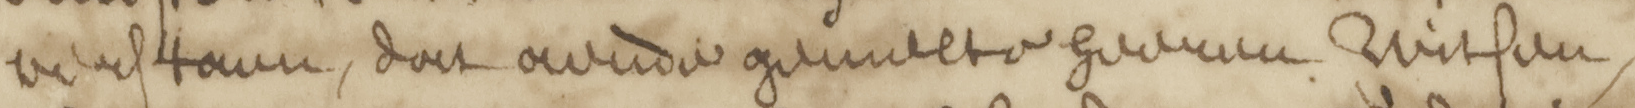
verstaen, dat aende gemelte heeren Witsen
